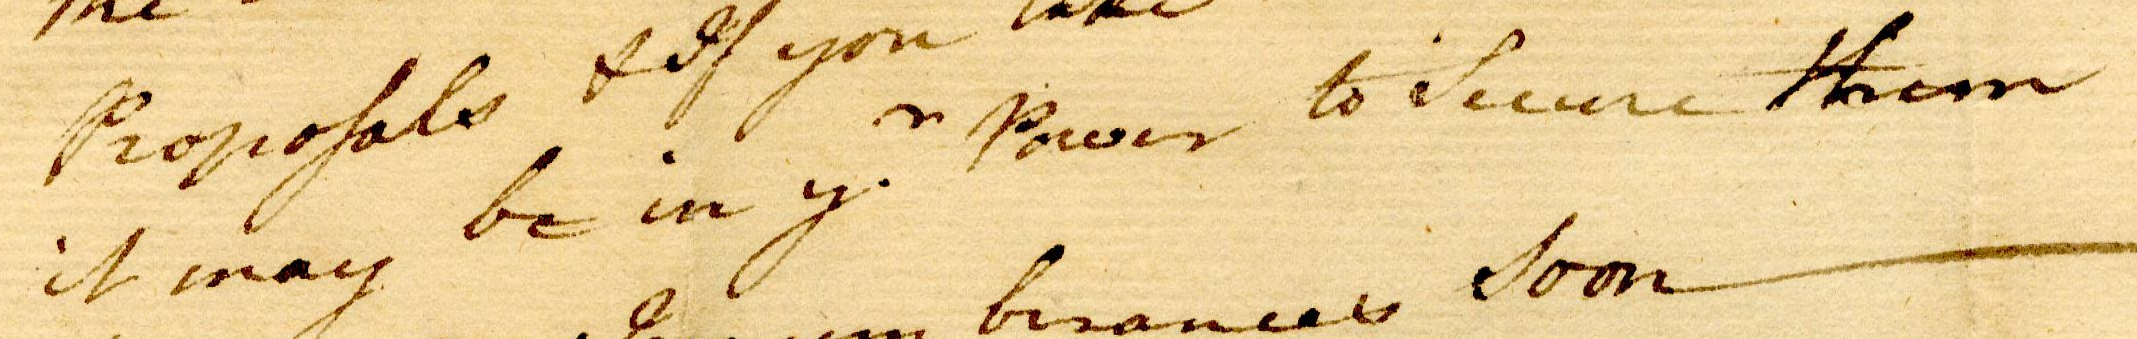it ay be in y^r. Power to secure them
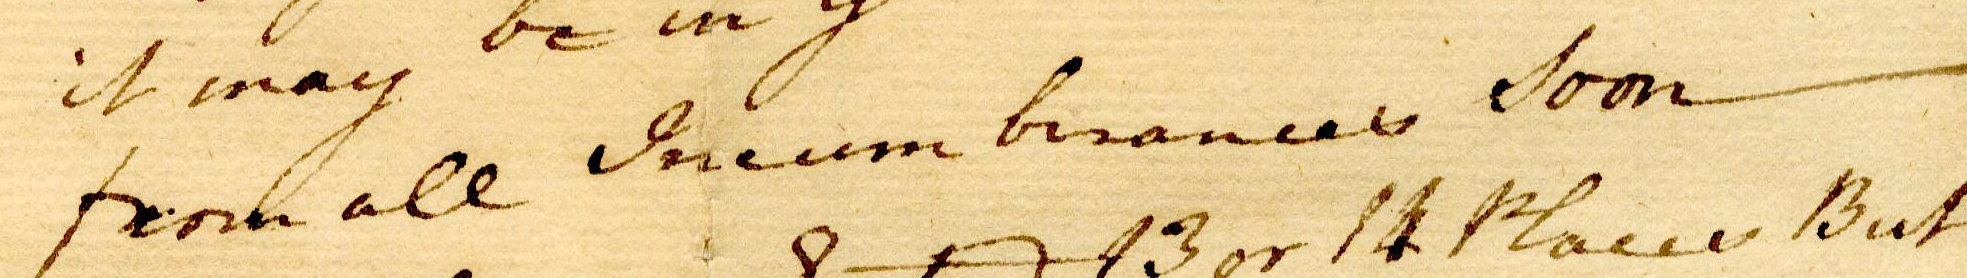from all Incumbrances soon
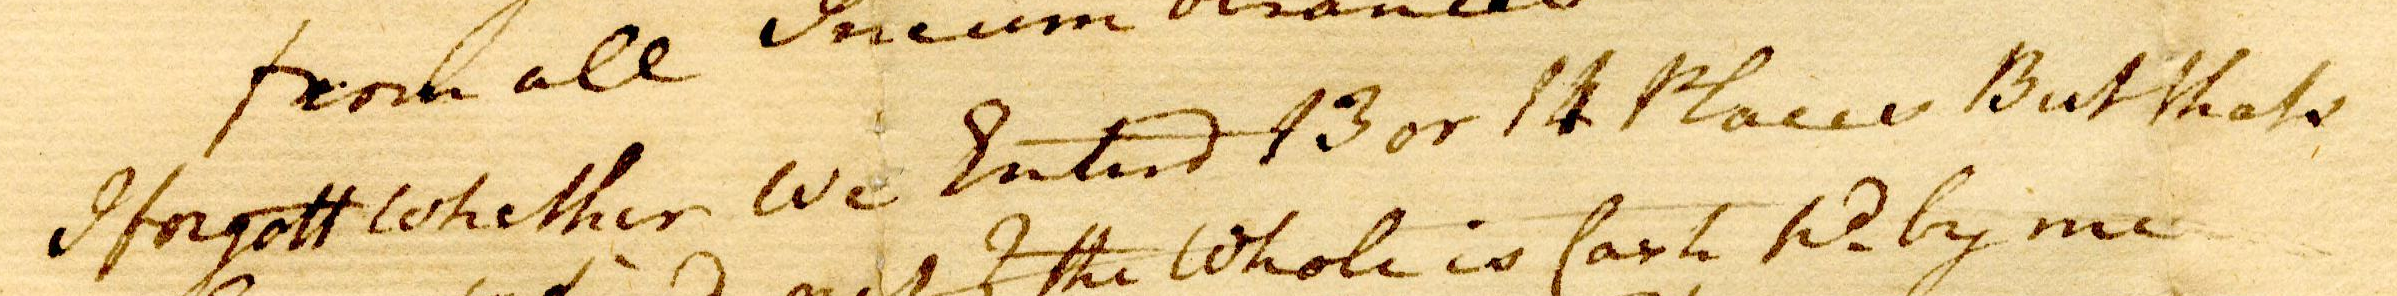I forgott whether we Enterd 13 or 14 Places But thats
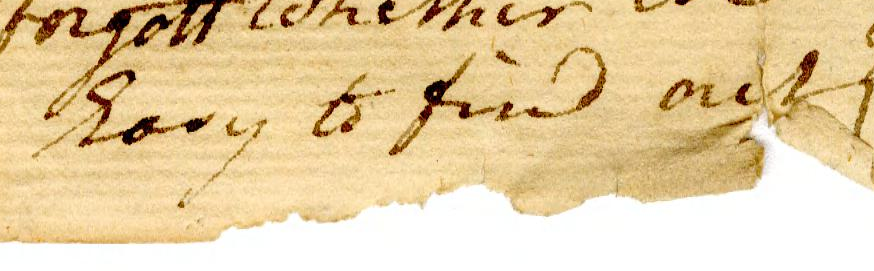Easy to find out
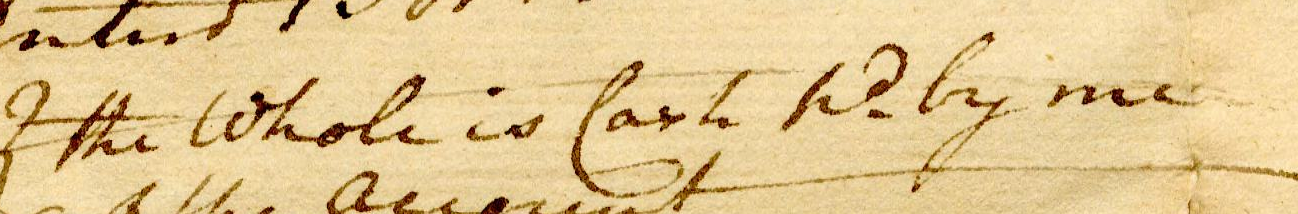the whole is Cash^d. by me
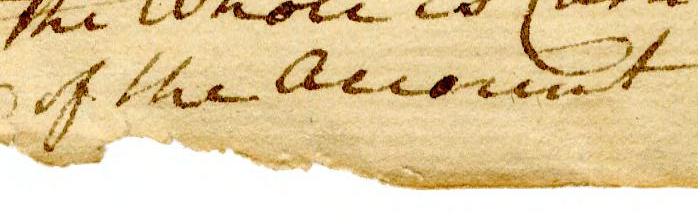of the account
